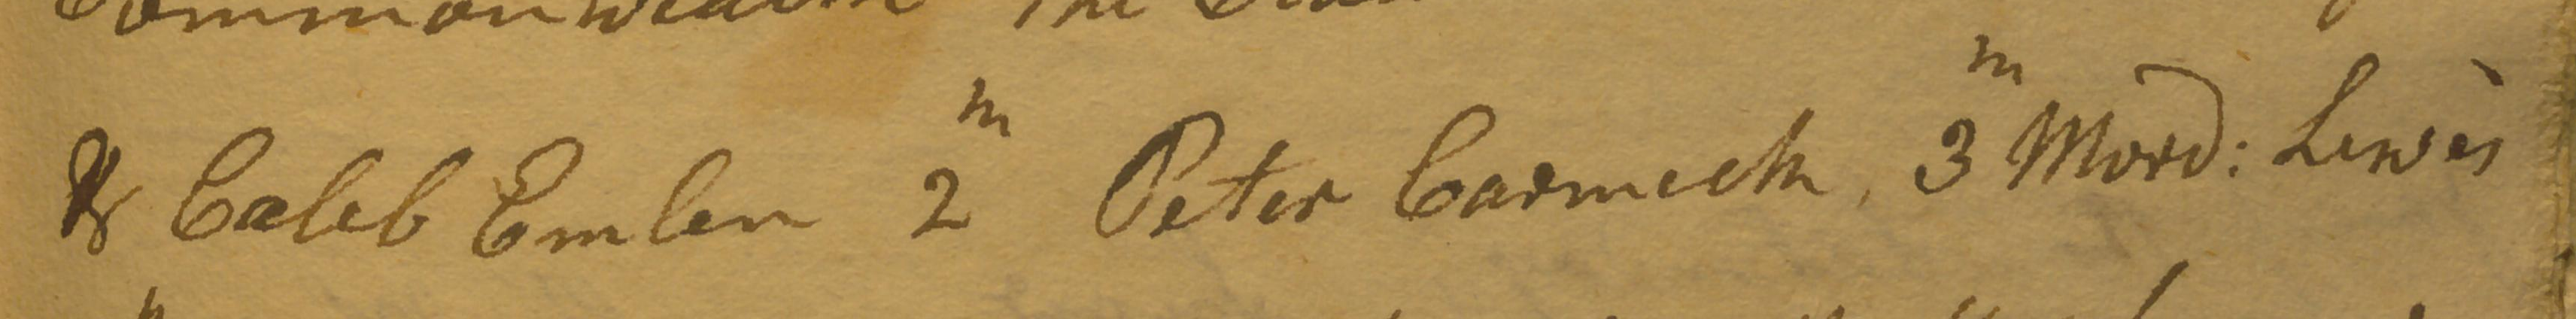& Caleb Emlen 2^th Peter Carmick, 3^th Mord. Lewis
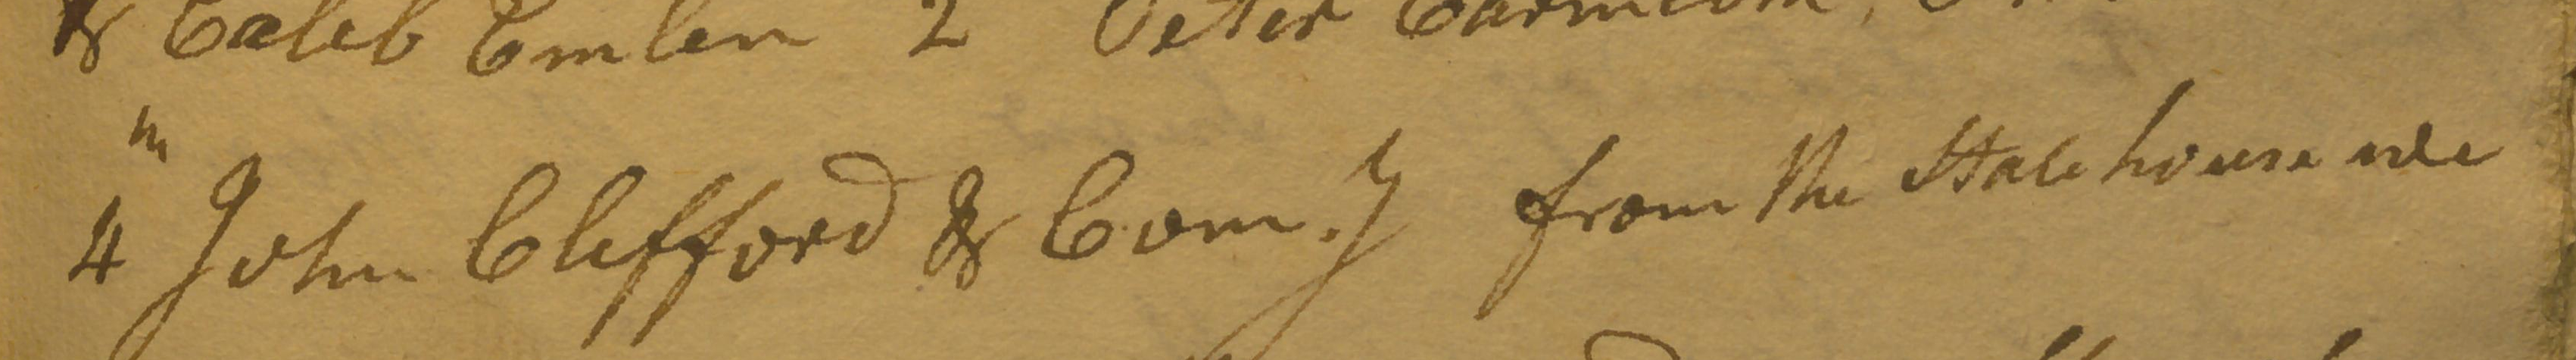4^th John Clifford & Com^y. from the State house we
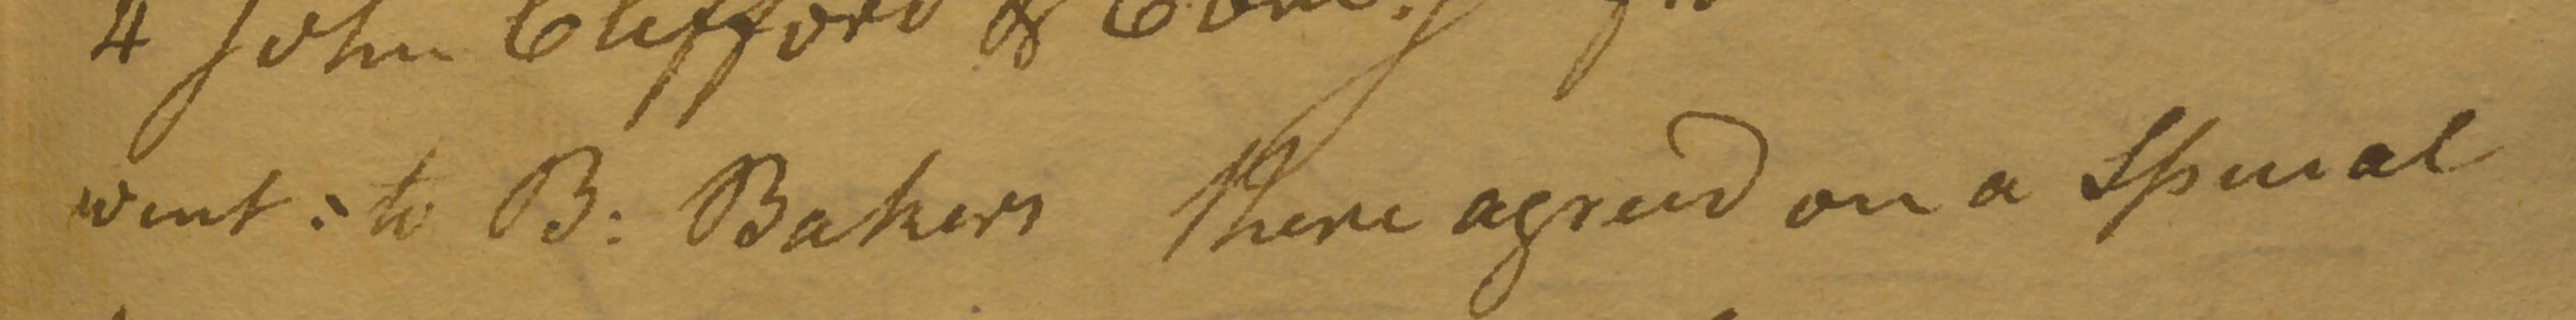went to B: Bakers there agreed on a Special
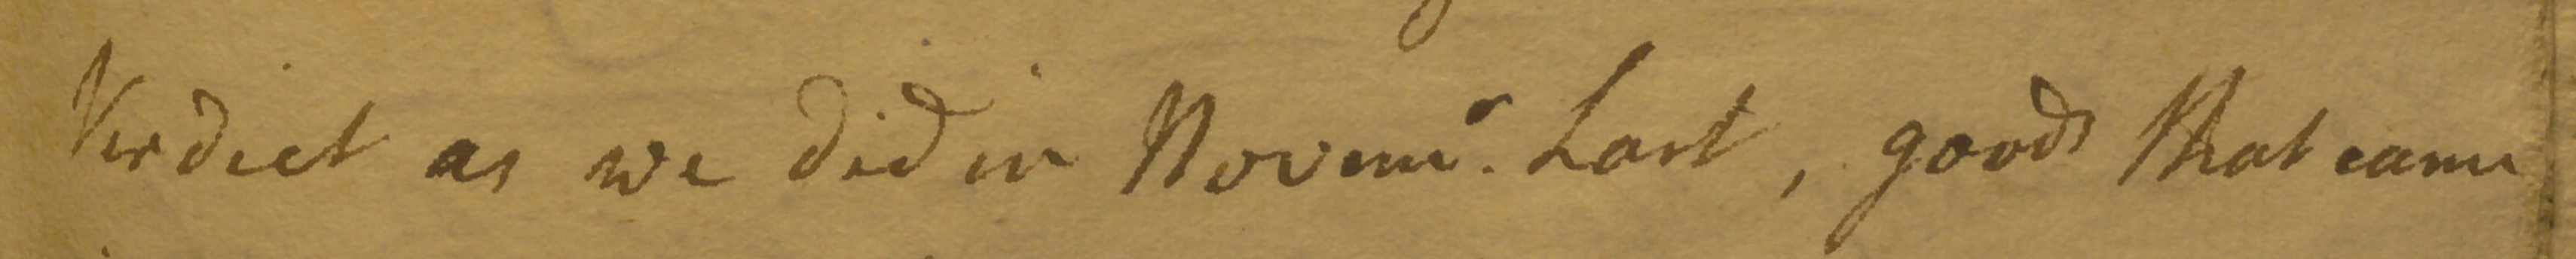Verdict as we did in Novem^r. Last, goods that came
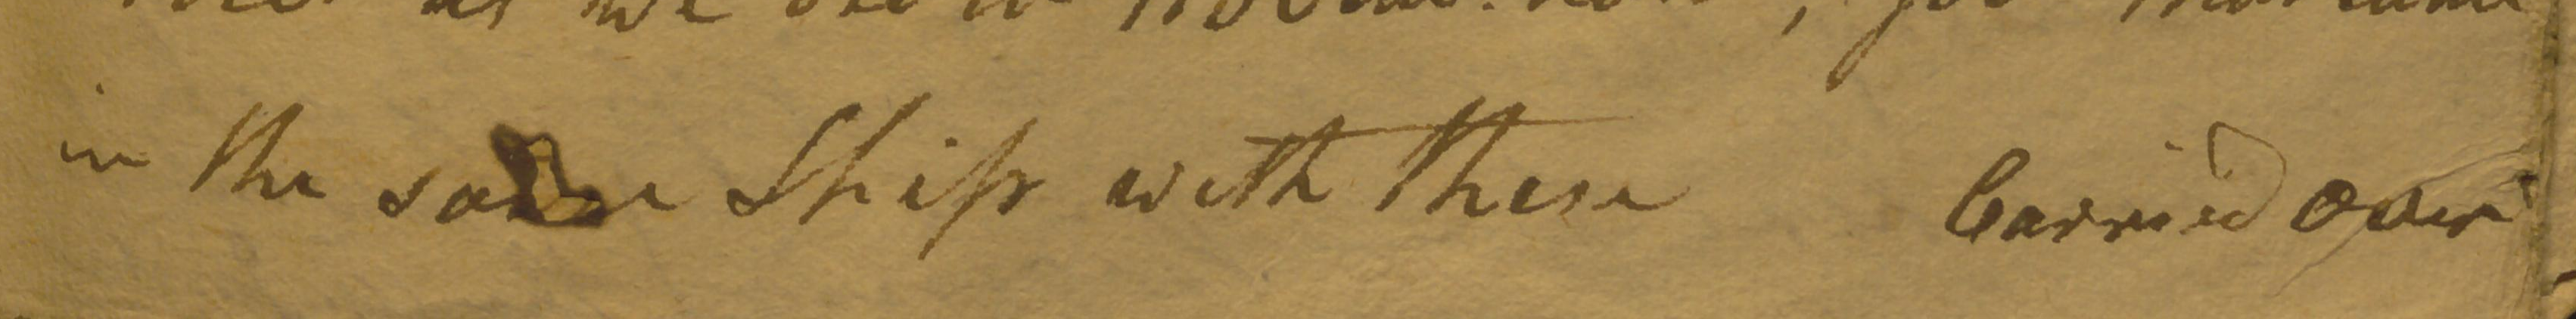in the same Ship with these Carried over
